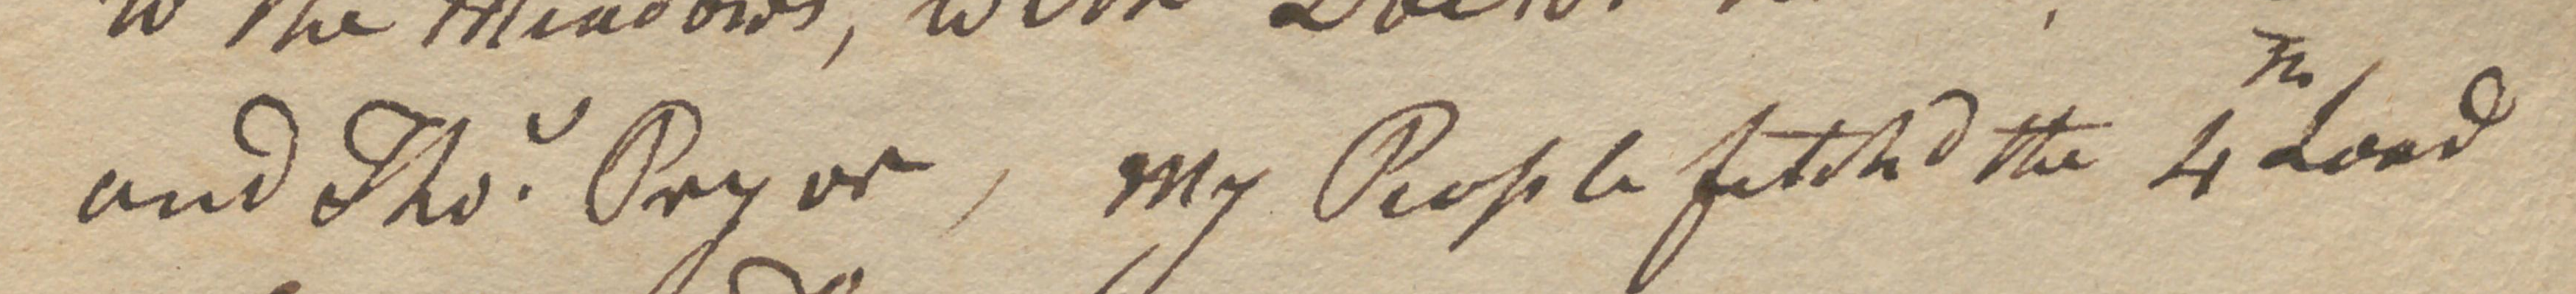and Tho^s. Pryor, My People fetch^d the 4th Load
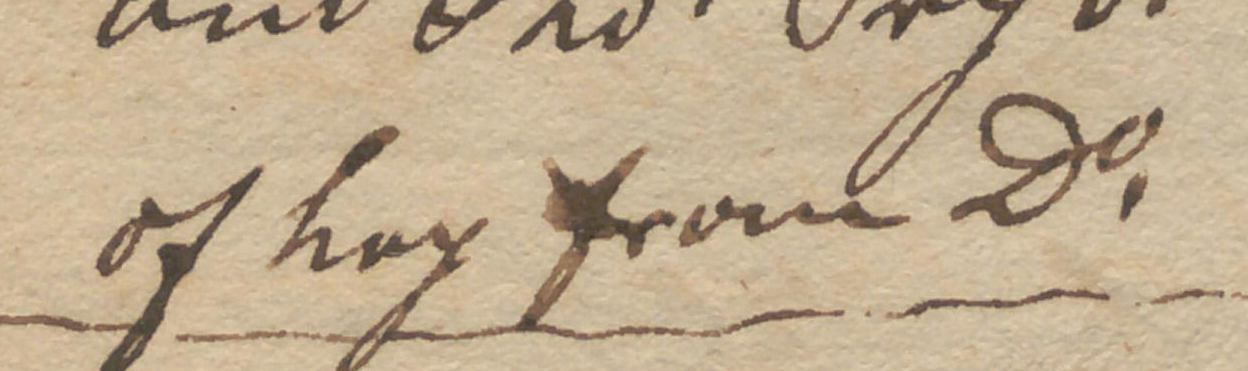of hay from D^o.
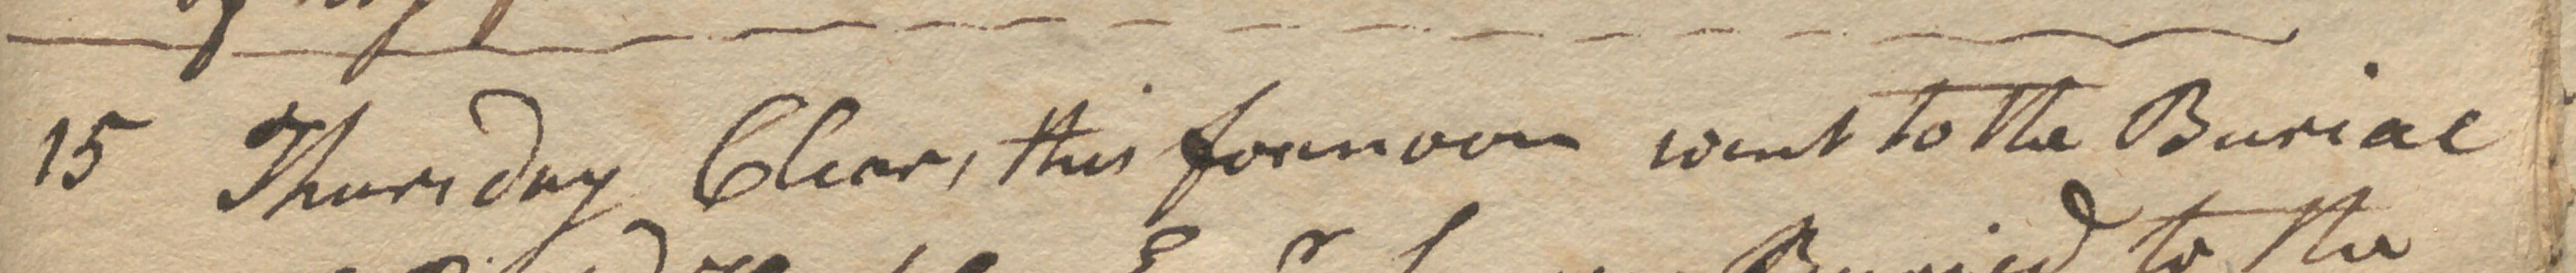15 Thursday Clears this fornoon went to the Burial
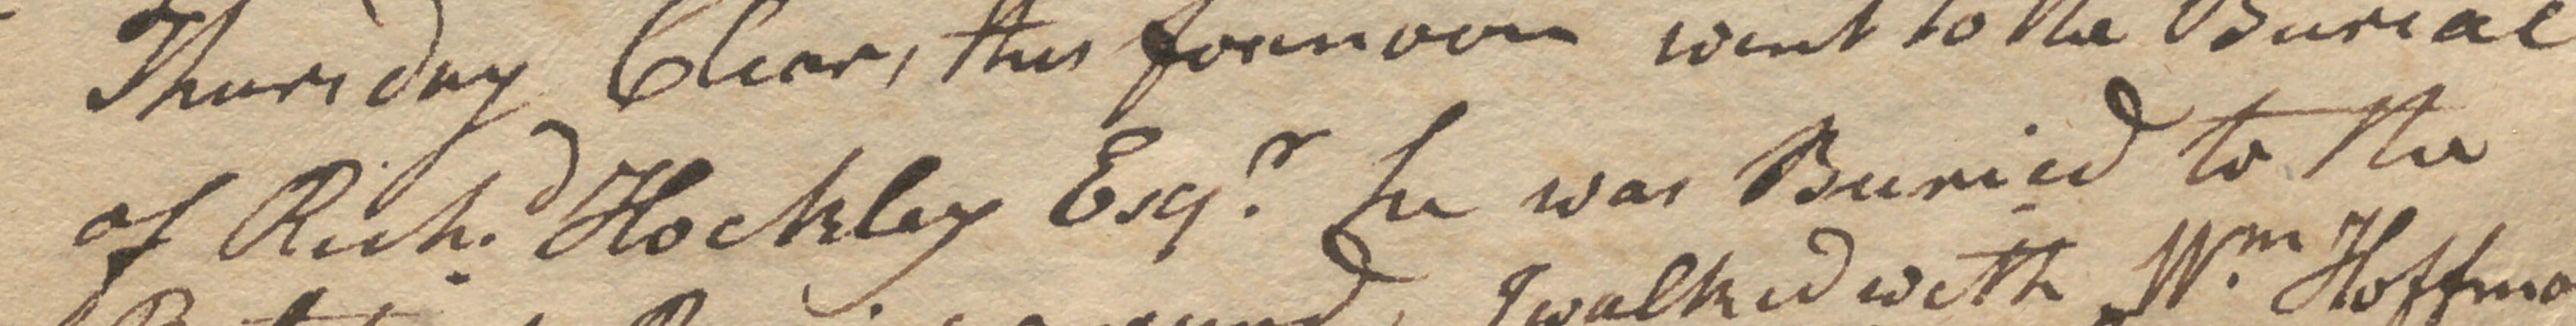of Rich^d. Hockley Esq^r. he was Buried to the
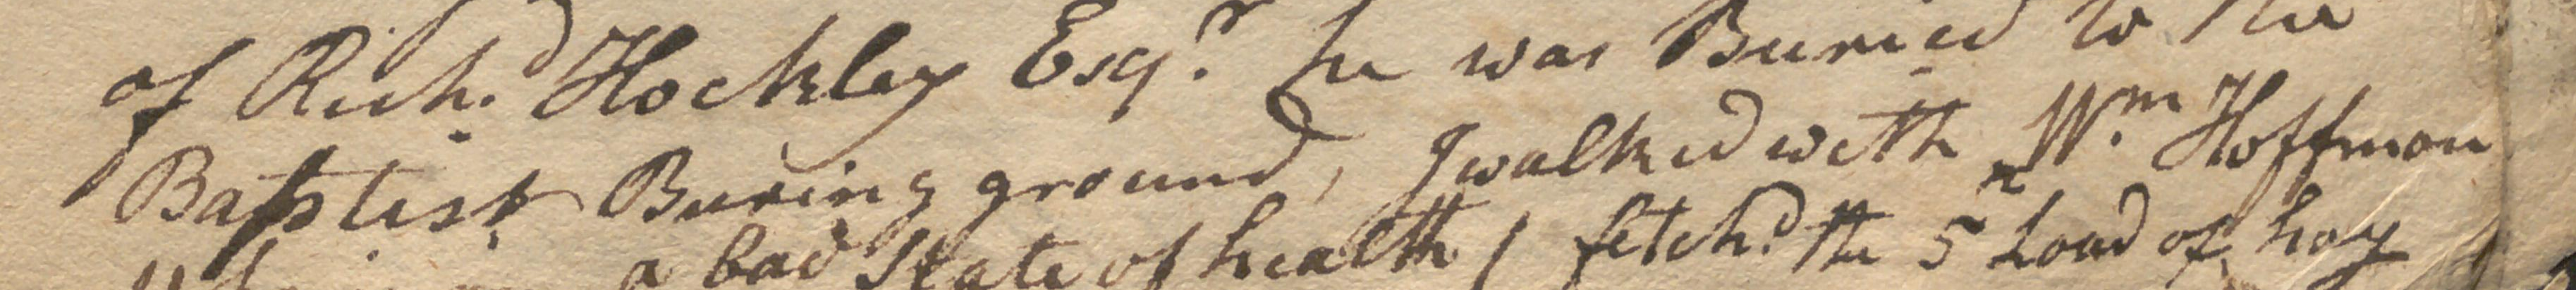Baptist Buring ground, I walked with W^m. Hoffman
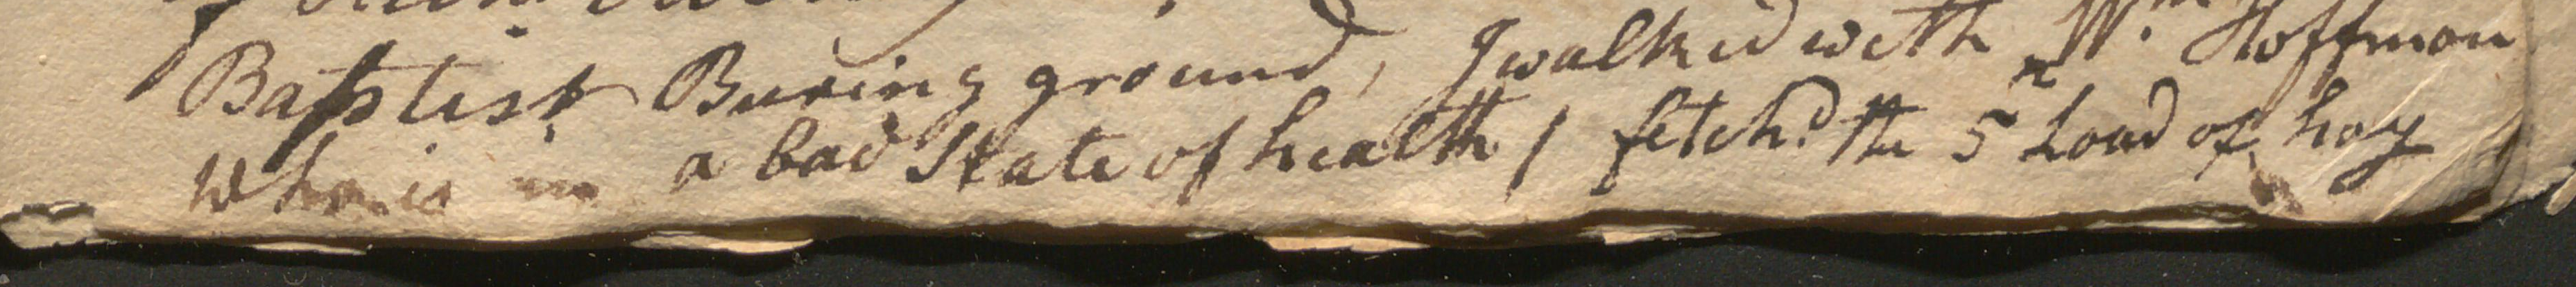Who is in a bad Slate of health / fetch^d the 5^th Load of hay
